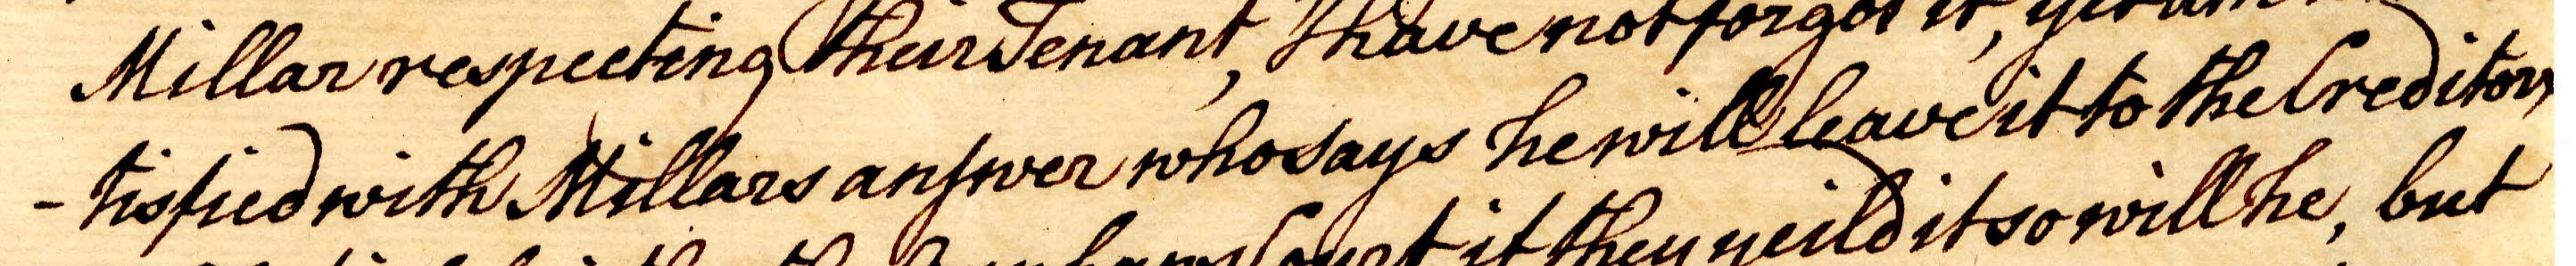-tisfied with Millars answer who says he will leave it to the Creditors
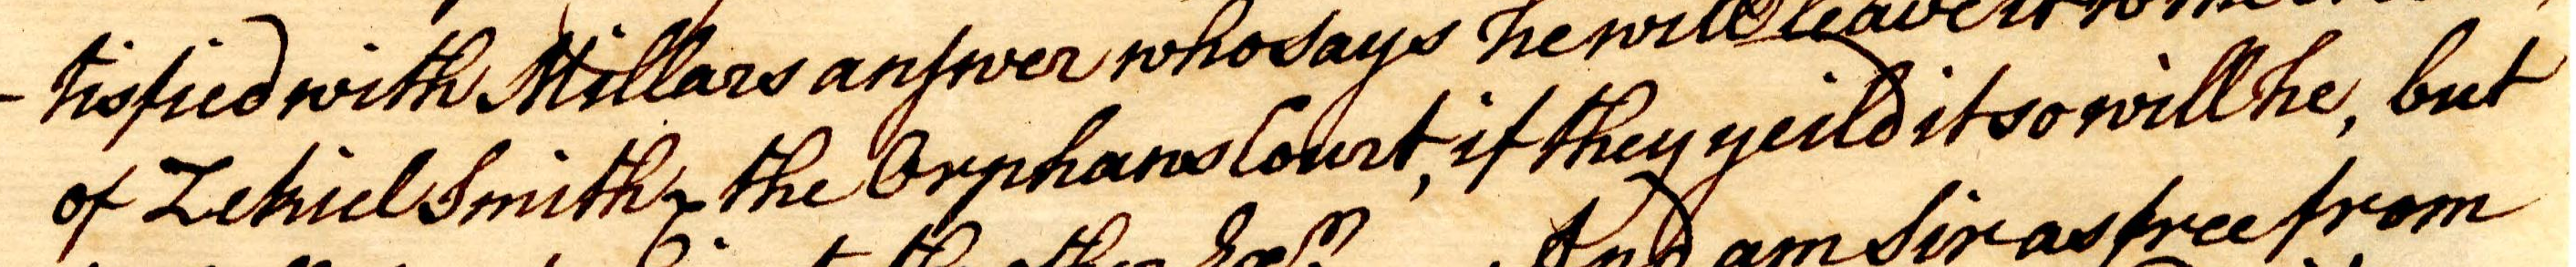of Zekiel Smith, the Orphans Court, if they yeild it so will he, but
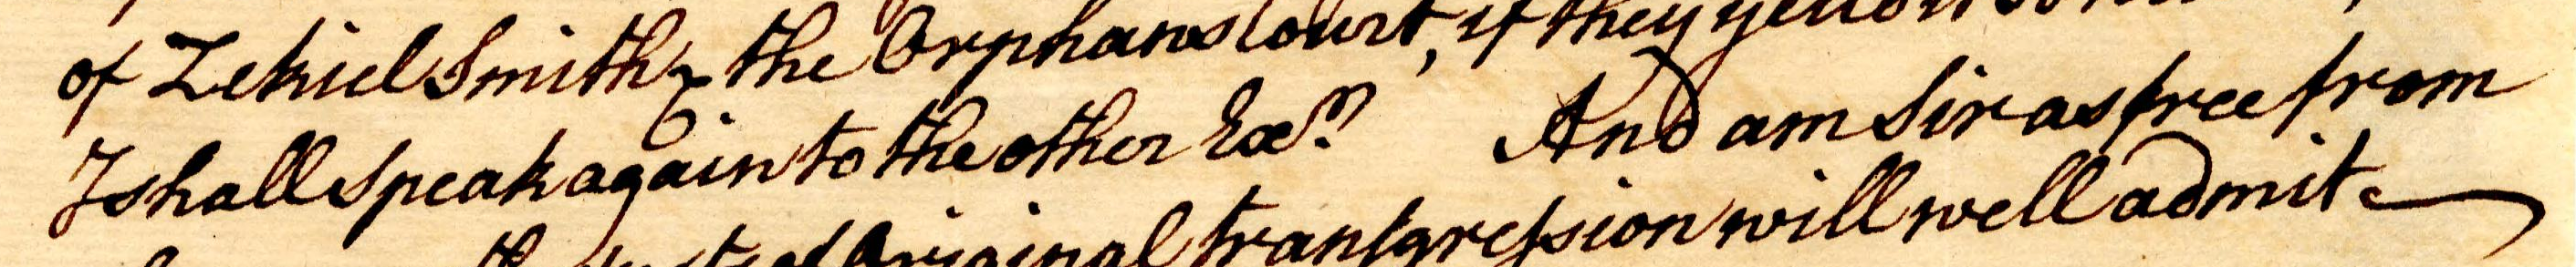I shall speak again to the other Ex^r. And am Sir as free from
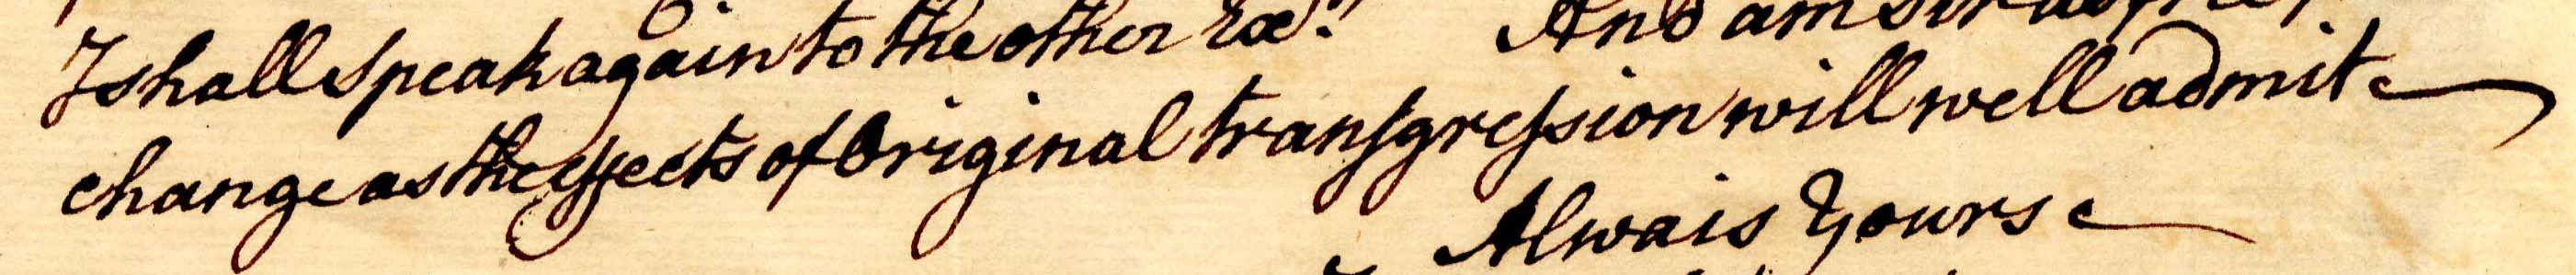change as the effects of Original transgression will well admit-
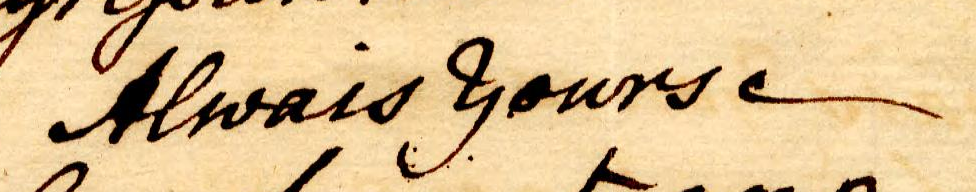Alwais Yourse
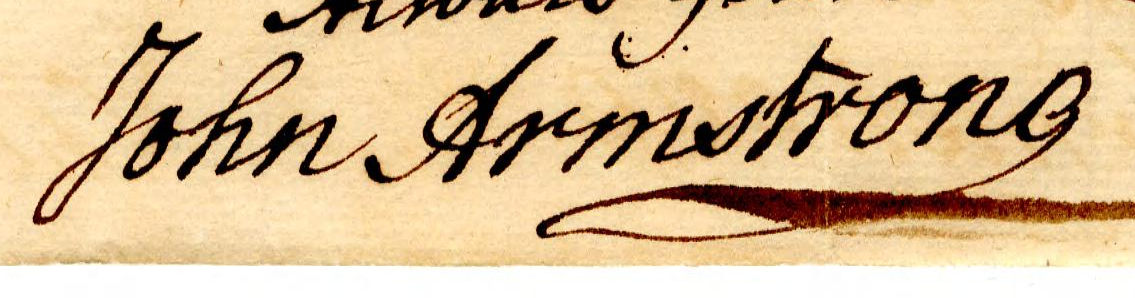John Armstrong
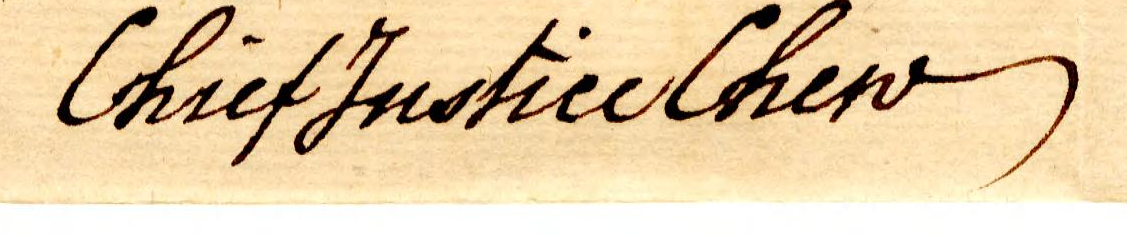Chief Justice Chew
